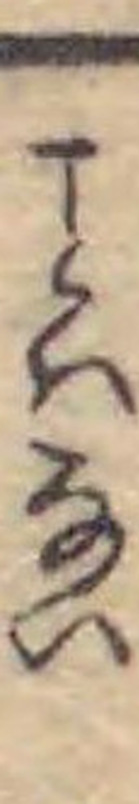ことはない
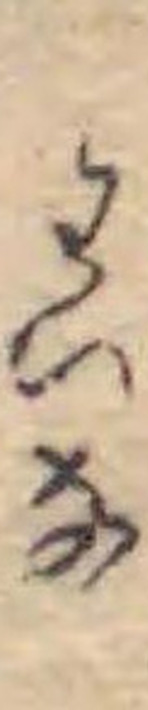わいな

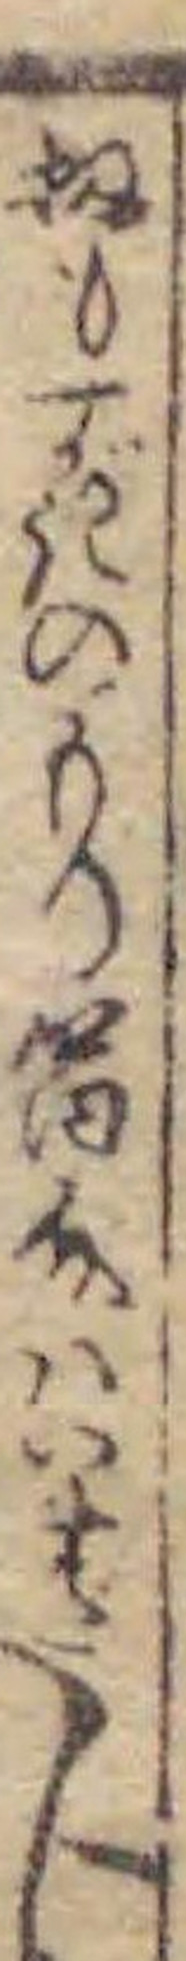扨もすぎのもり富介はいまだ
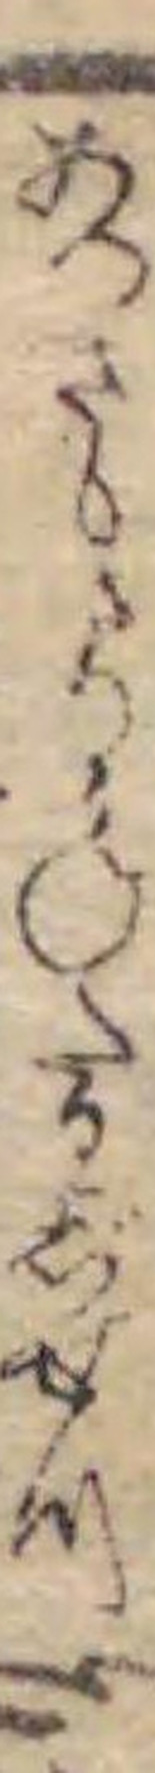あつさもさりかねたるじせつ
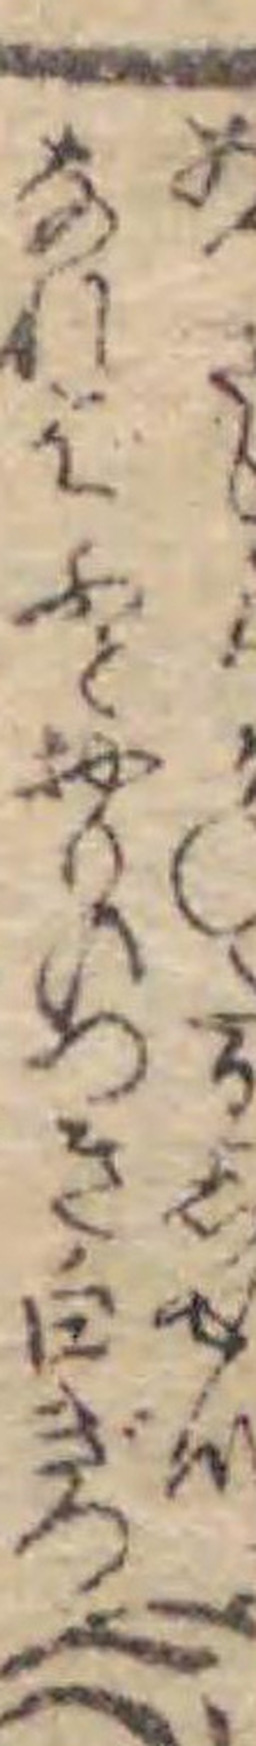なればふとおもひつき白ぎつ
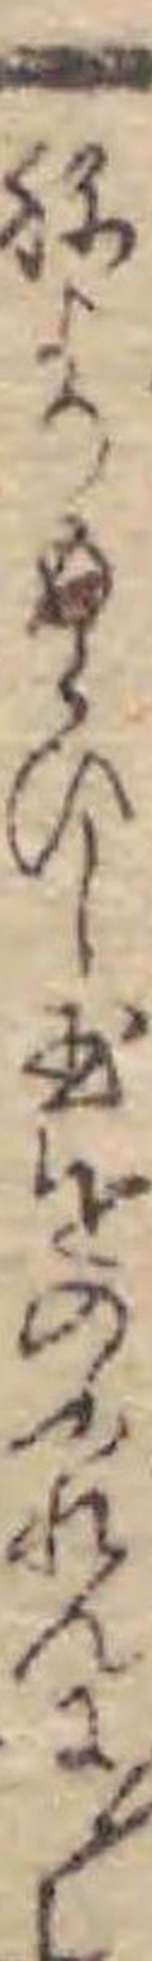ねよりもらひし玉をのふれんに
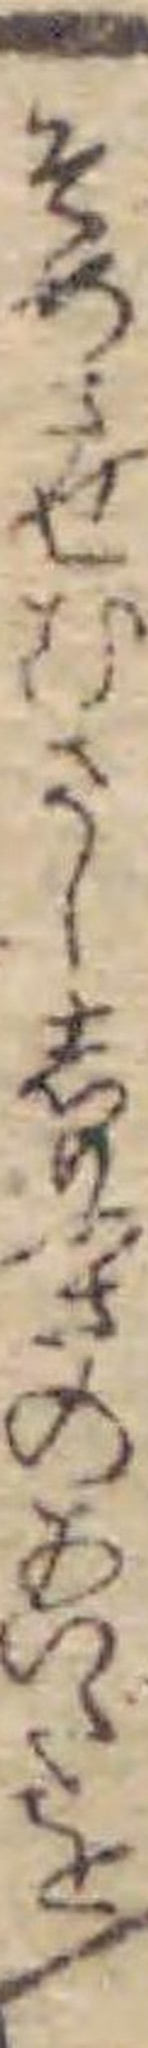そめさせむさししもふさのあいだを
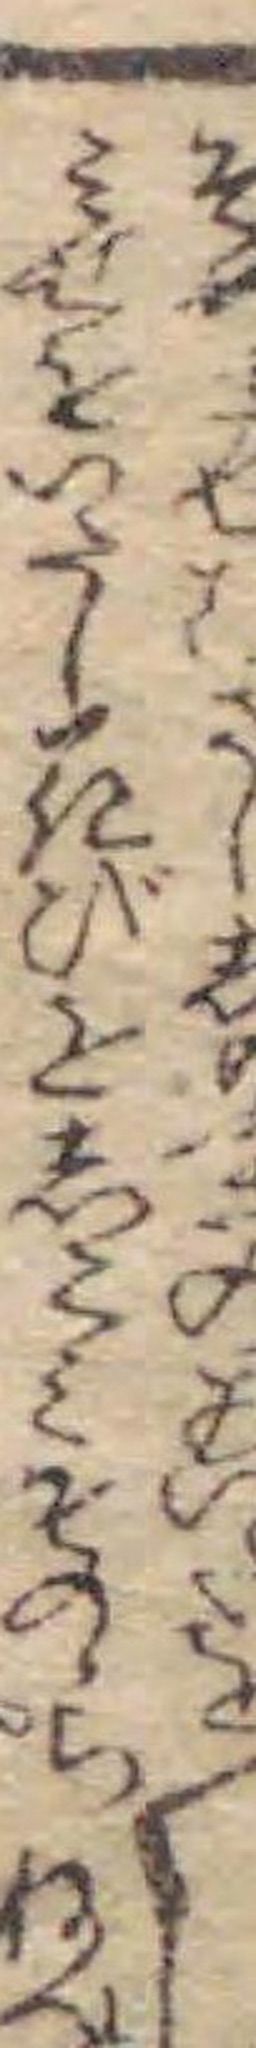みせをいたし花びをしこみそのゝちねん〳〵
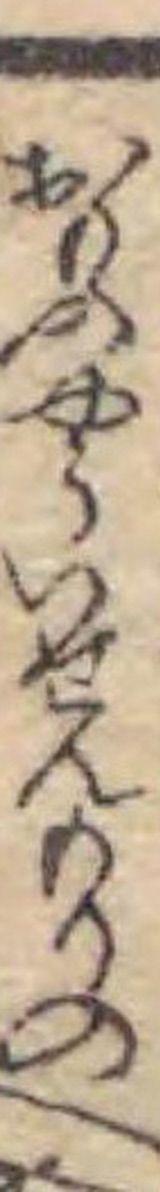おもふやういせんもりの
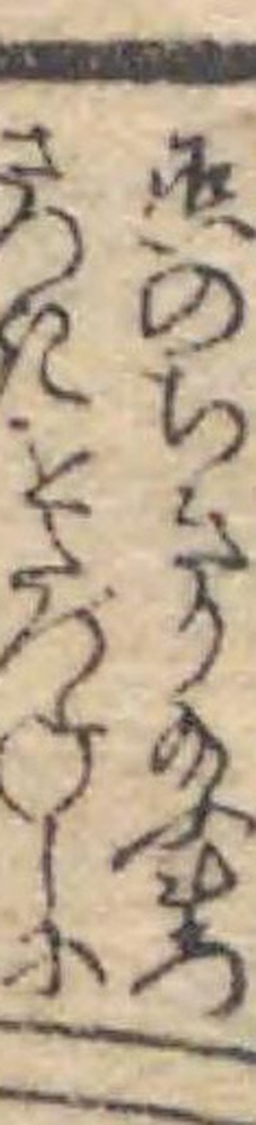さきをたづねしに
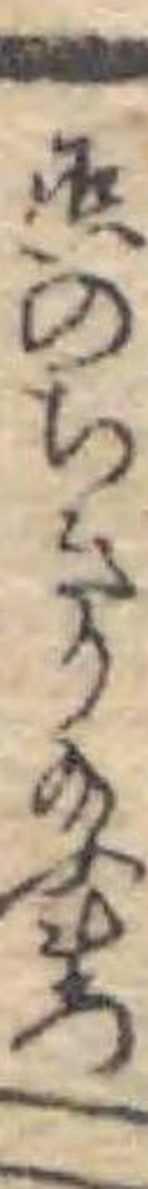丞のちぎり給ふまつ
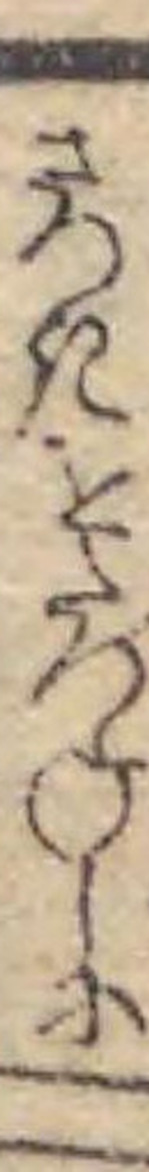さきをたづねしに
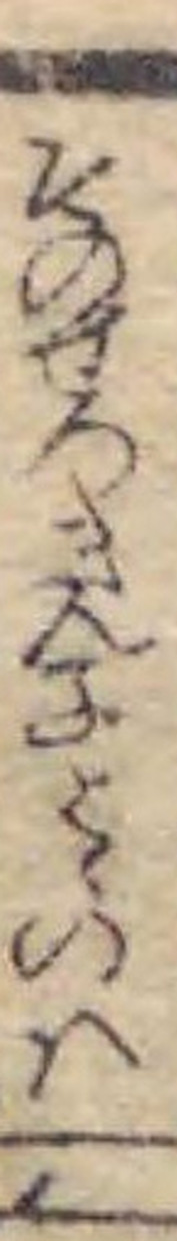そのせつきん子とゝのは
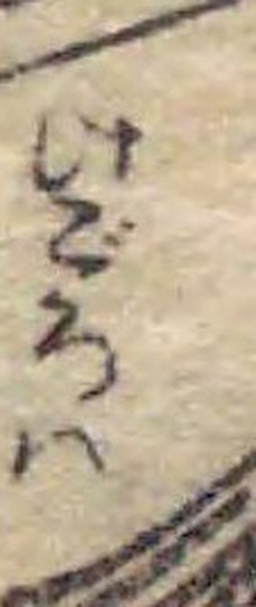此ごろは
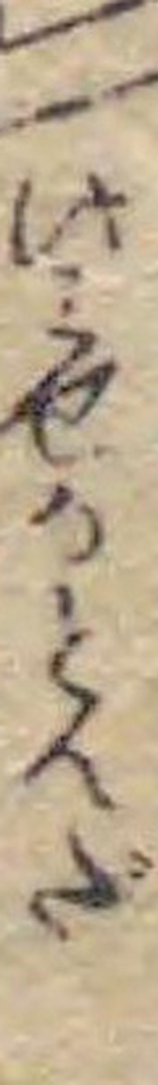此みせかとんだ
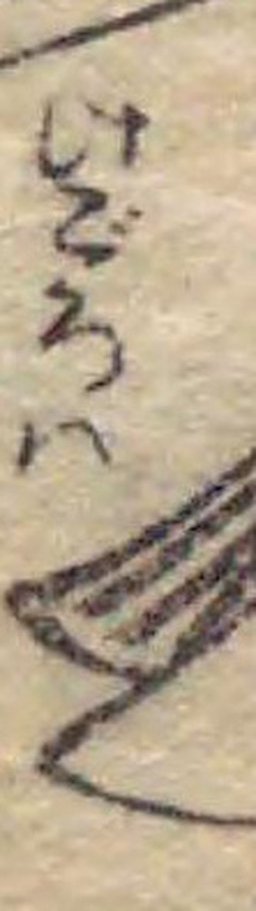此ごろは
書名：扨化狐通人 : 2巻
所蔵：国立国会図書館 National Diet Library, JAPAN
